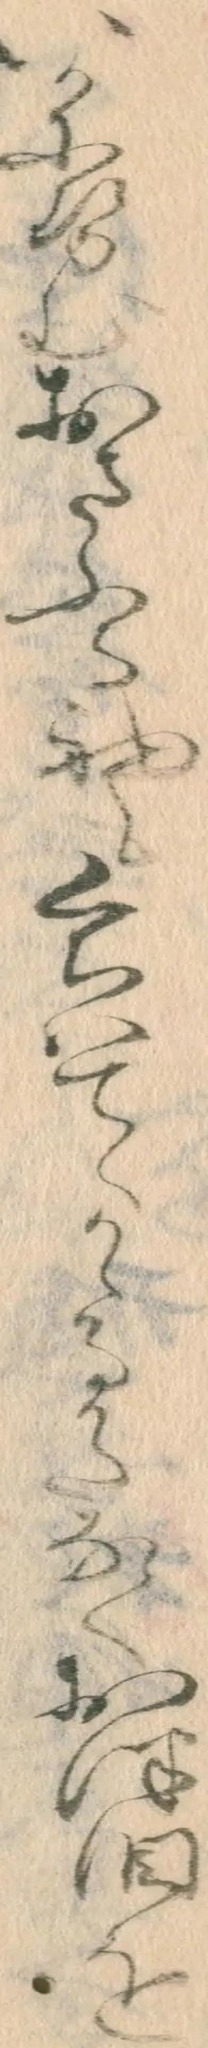いかにせむおさふる袖もくちはてゝかゝるかたなくおつ涙を
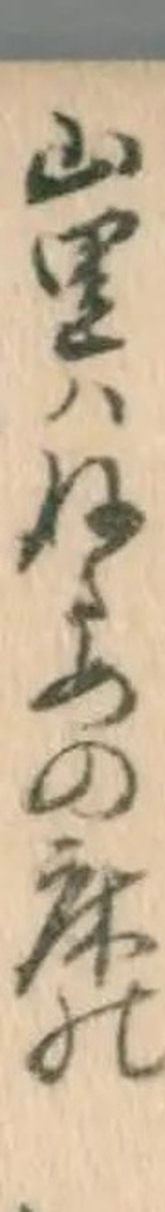山里はねさめの床の
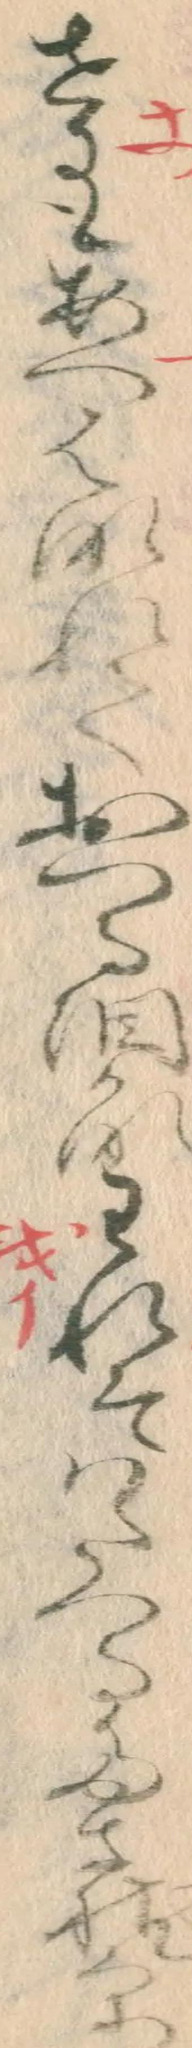せにもあつはなれておつる涙かなわれそはたつるたき枕なり
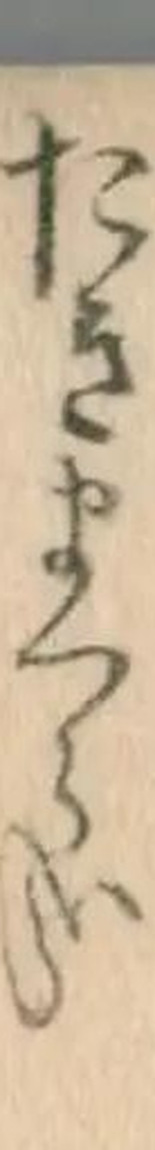たきまくら哉
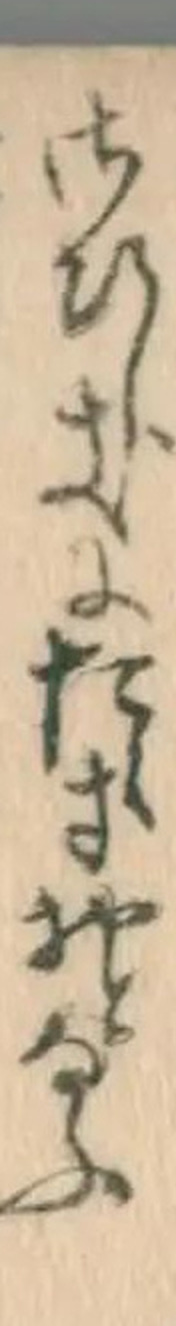さひしきにたえすおとなふ
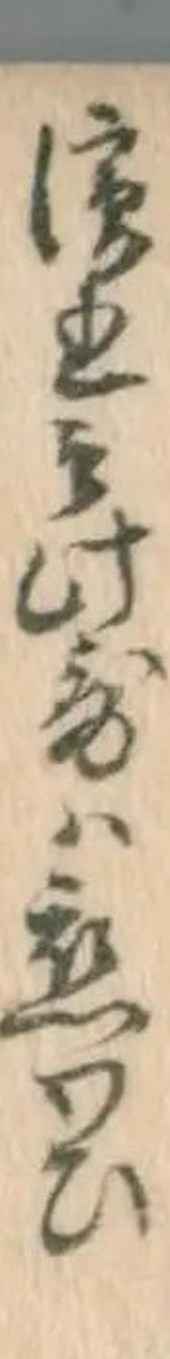浜臣云此歌は恋わひ
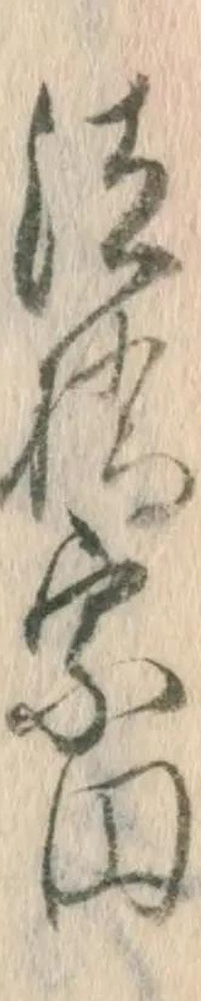法橋宗円
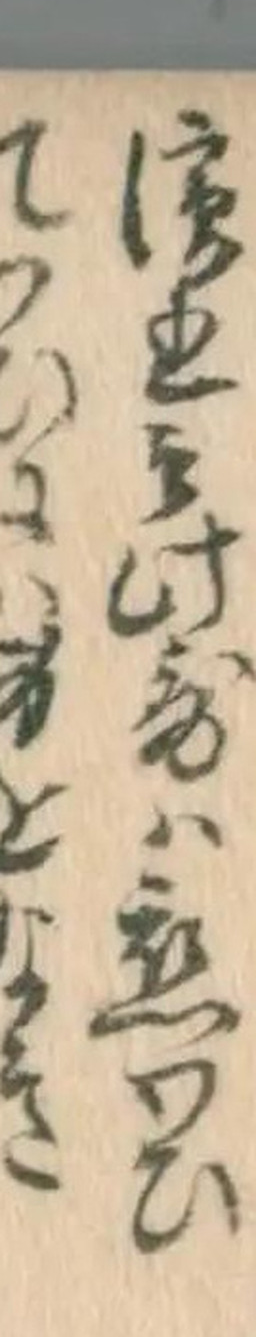てつひには身をなき
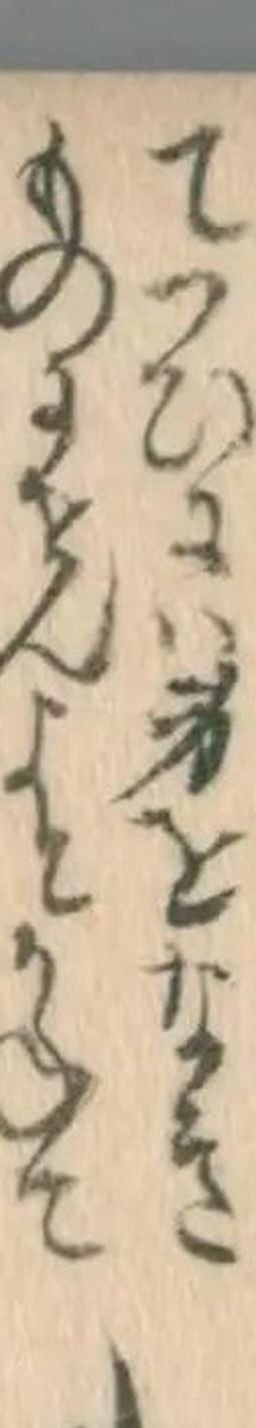ものにせんことかねて
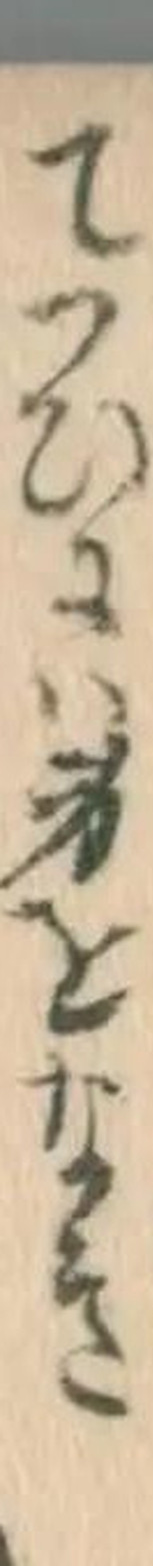てつひには身をなき
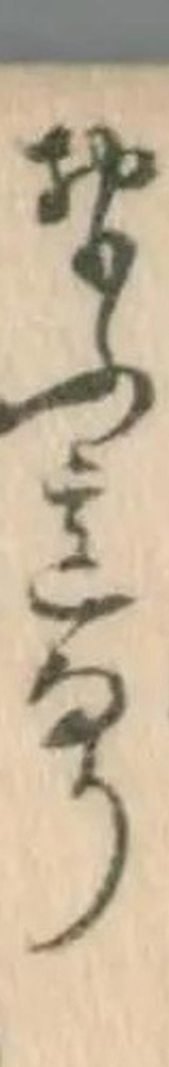おもふ意なり
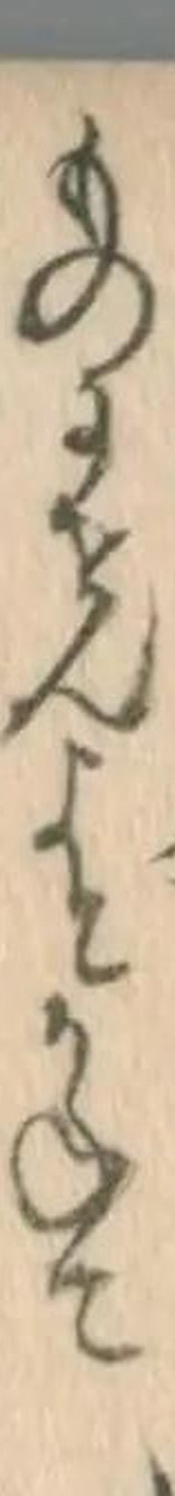ものにせんことかねて
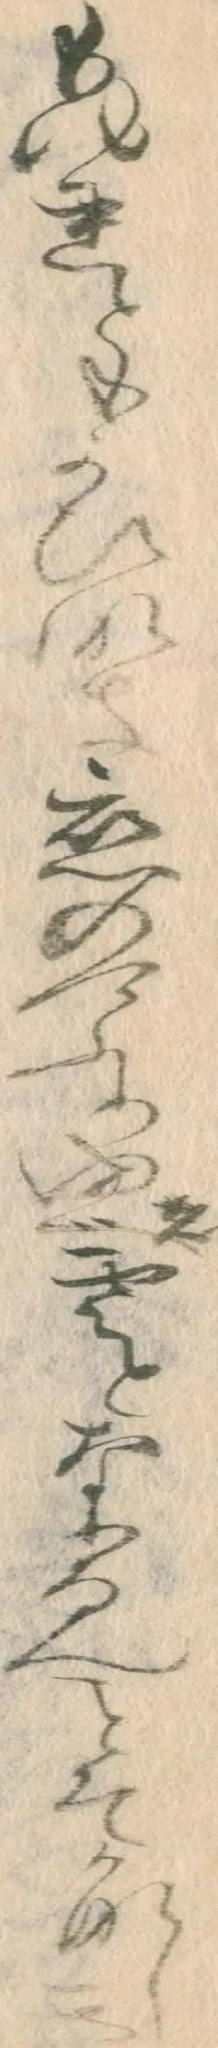もゆれともかひなき恋のけふりゆへゑ雲となりなんことそかなしき
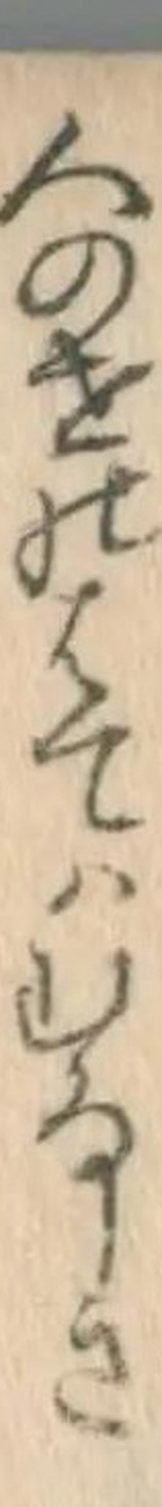人の世のはてはむなしき
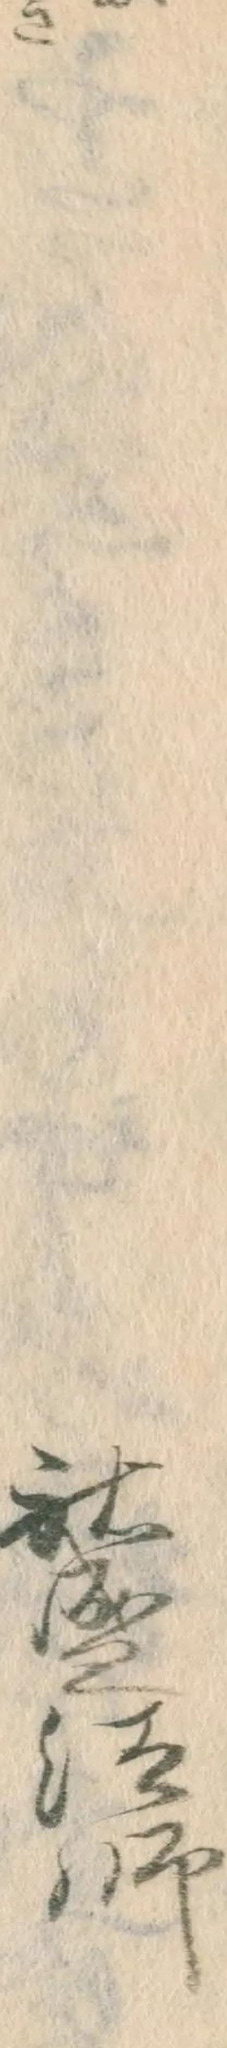祐盛法師
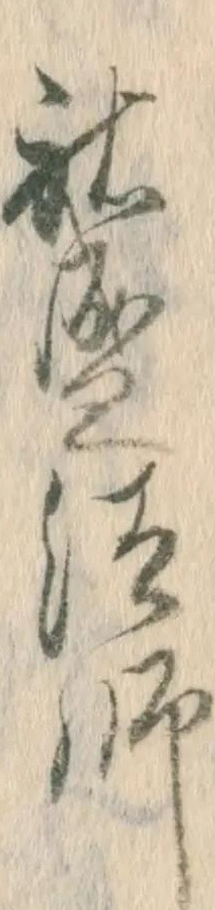祐盛法師
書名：月詣和歌集
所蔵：国立国会図書館 National Diet Library, JAPAN
